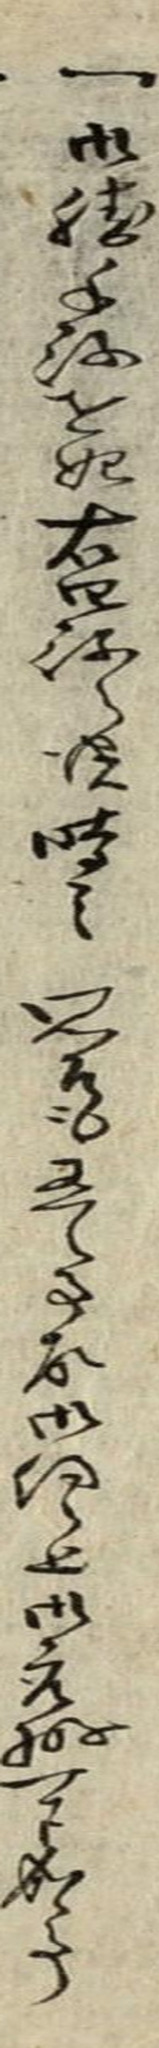一御勝手役を始右四役之儀は時之思召も有之事故御伺之上御取扱可被成候事
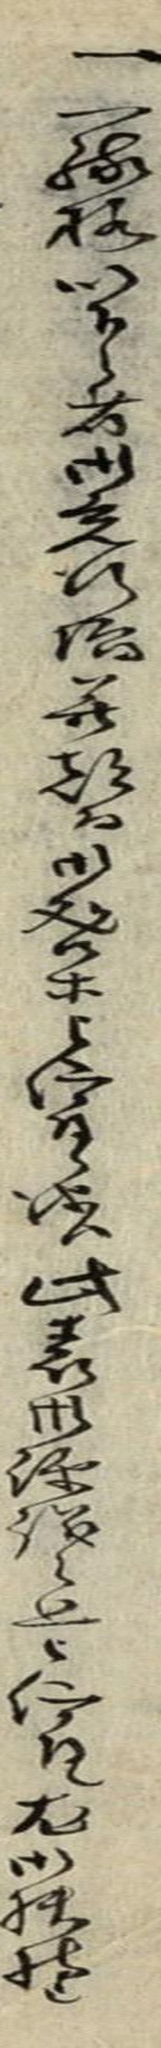一一統格以下之者御充行増并都而御咎等被仰付候儀は此表御評議之上被仰付候尤御扶持被
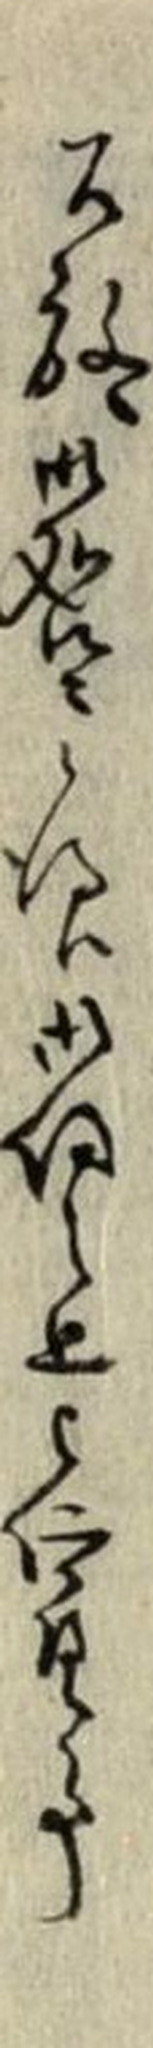召放御咎に候得は御伺之上被仰付候事
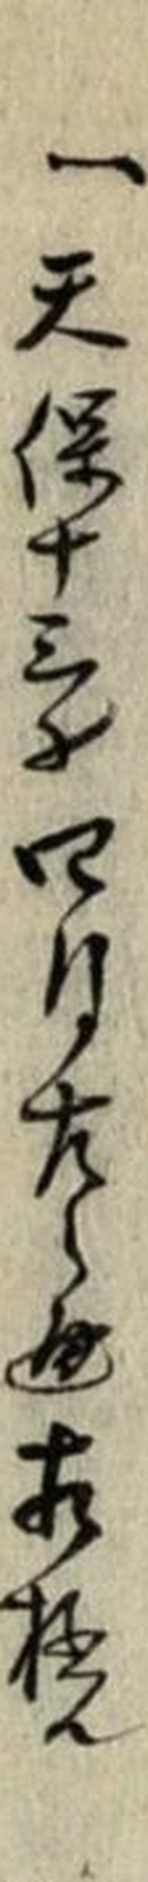一天保十三寅四月左之通相極ル
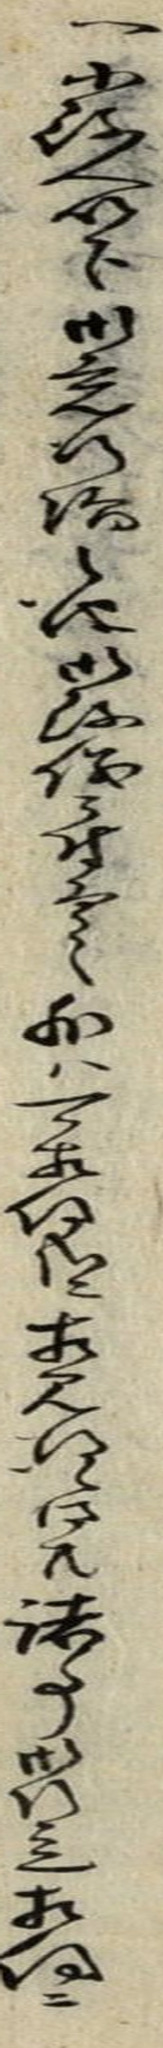一小役人以下御充行増之儀御役儀に付而之外は可相伺哉に相見得候得共諸事御引立相伺に
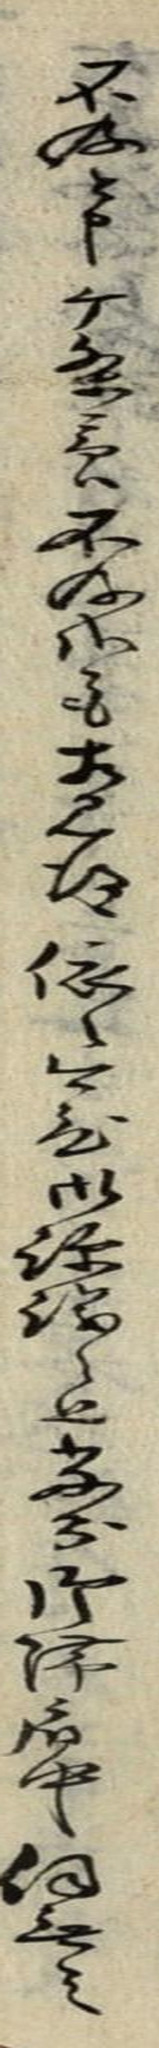不及と申ヶ条に而は不及哉にも相見得候依之今度御評議之上当分御滞府中伺無之
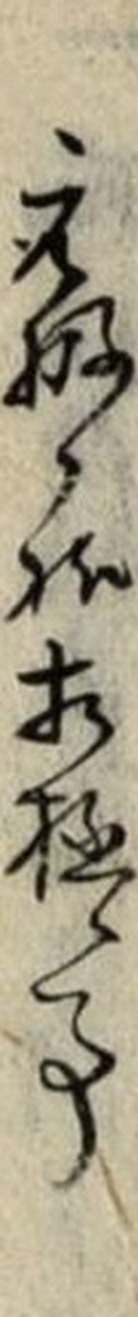取扱候様相極候事
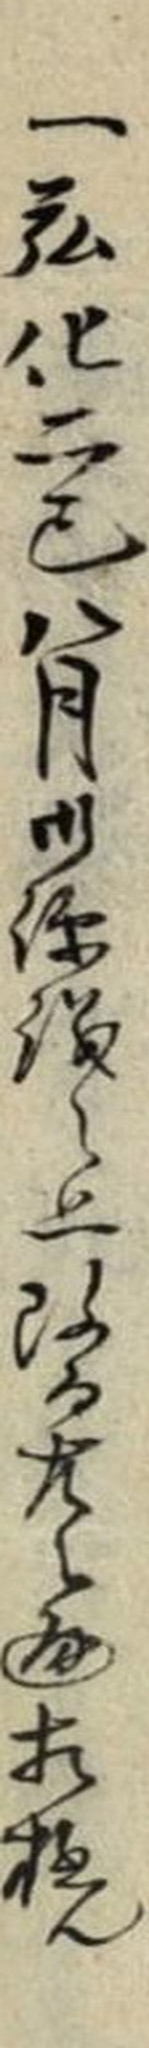一弘化二巳八月御評議之上改而左之通相極ル
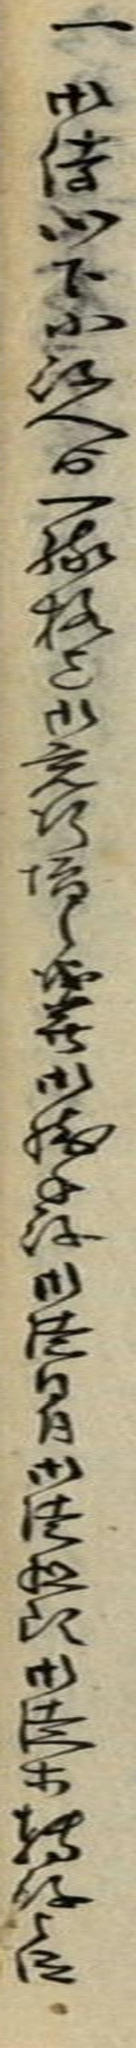一御侍以下小役人ゟ一統格迄御充行増之儀并御勝手役御徒目付御徒組頭御徒等転役被仰
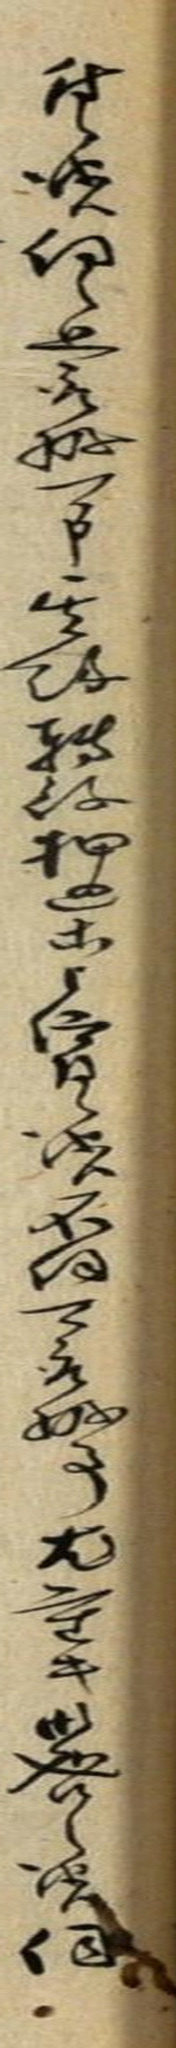付候儀は伺之上取扱可申其餘転役押込等被仰付候儀は不伺可取扱事尤重き御咎之儀は伺
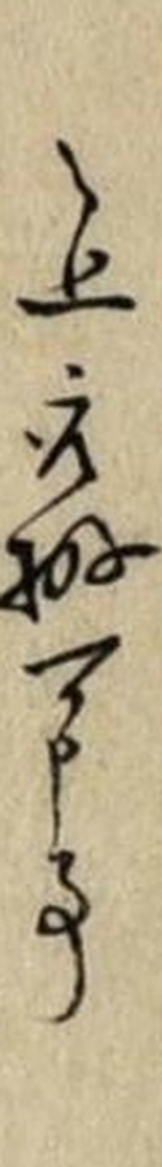之上御取扱可申事
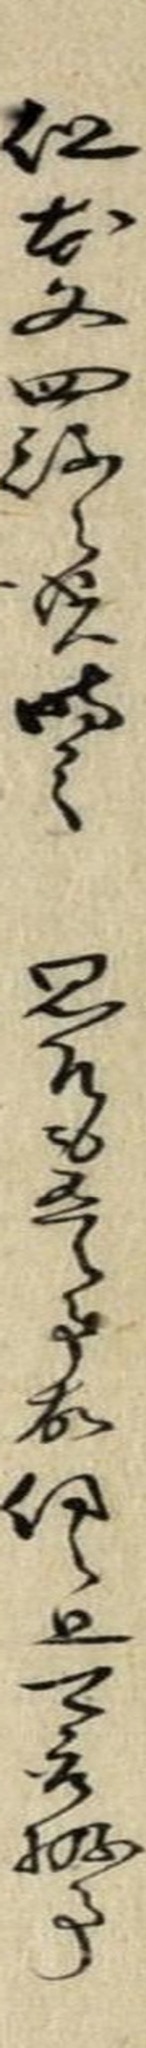但本文四役之儀は時之思召も有之事故伺之上可取扱事
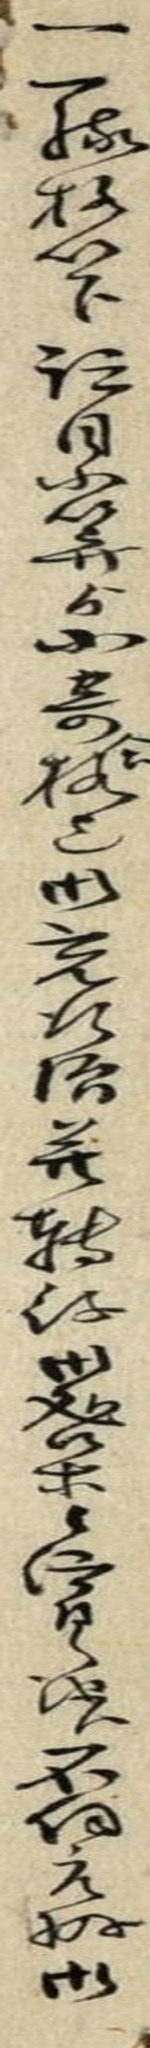一一統格以下跡目小算ゟ小寄合格迄御充行増并転役御咎等被仰付候儀は不伺取扱御
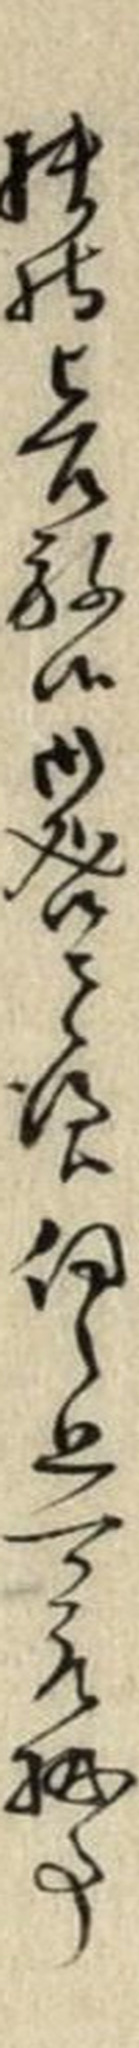扶持被召放候御咎に候得は伺之上可取扱事
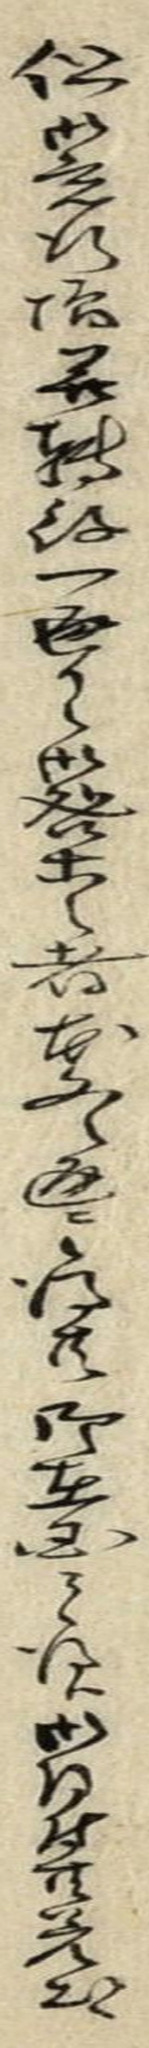但御充行増并転役一通り之御咎等之者本文之通に候得共御在国に候得は御目付共差出候
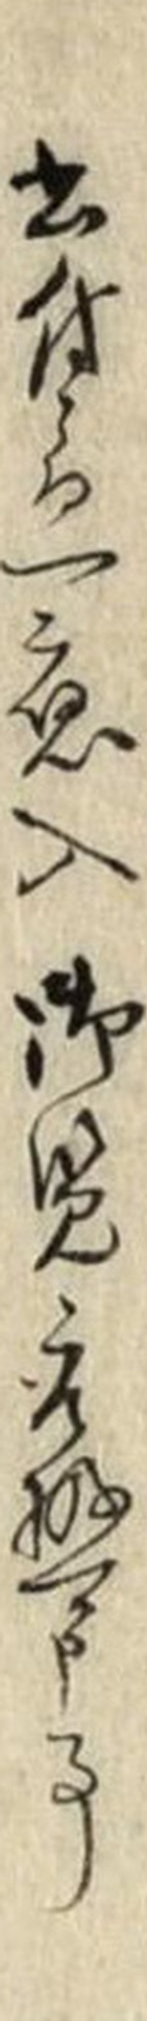書付に而一応入御覧取扱可申事
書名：御用并被仰出之部
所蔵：福井県文書館 Fukui Prefectural Archives
